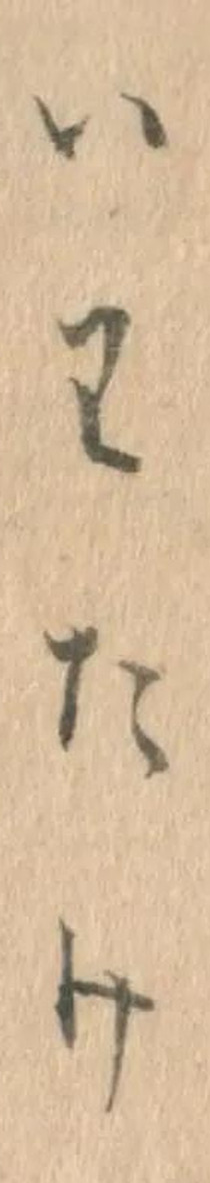いわたけ
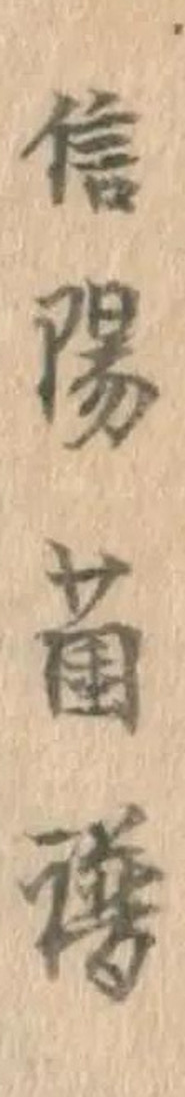信陽菌譜
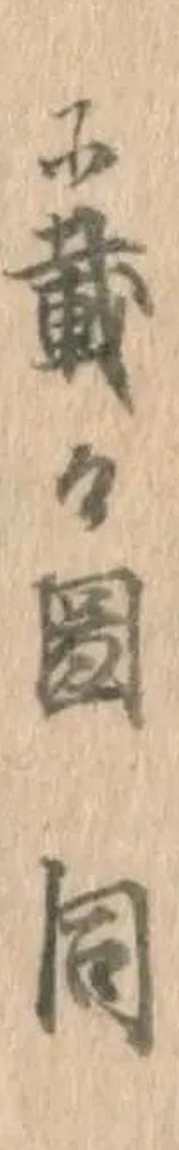に載る図同
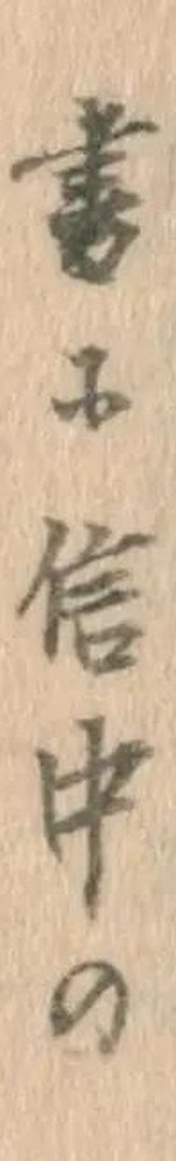書に信中の
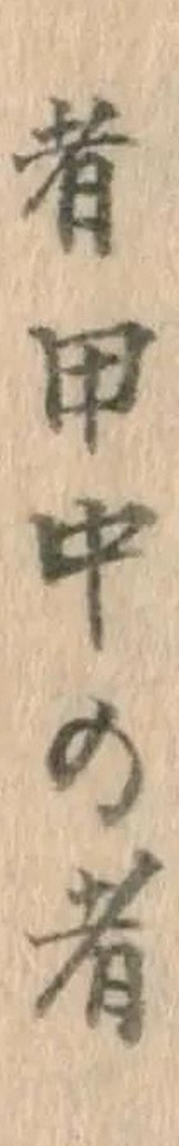者甲中の者
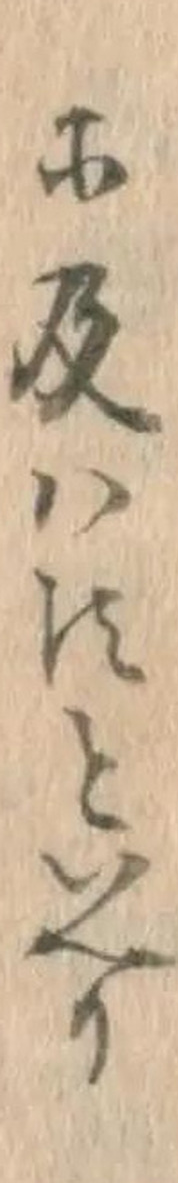に及はすといへり
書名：本草図譜. 巻58-60
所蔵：国立国会図書館 National Diet Library, JAPAN
